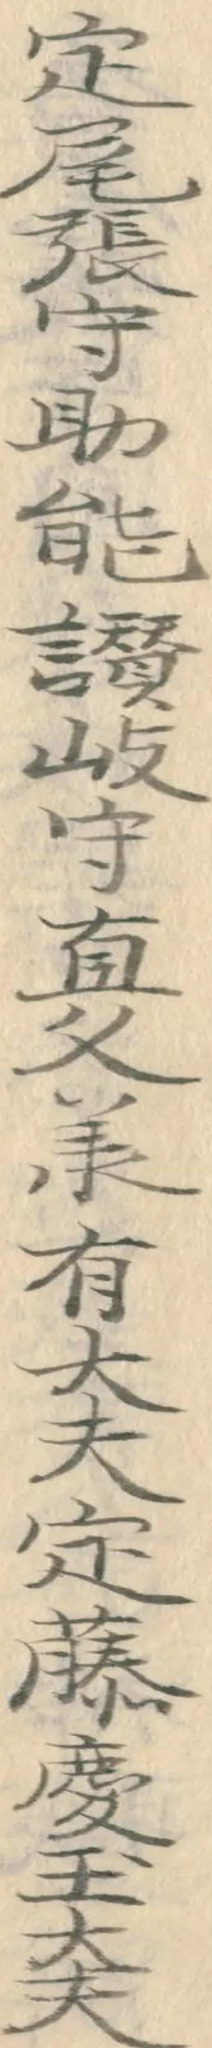定尾張守助能讃岐守直久承有大夫定藤慶玉大夫
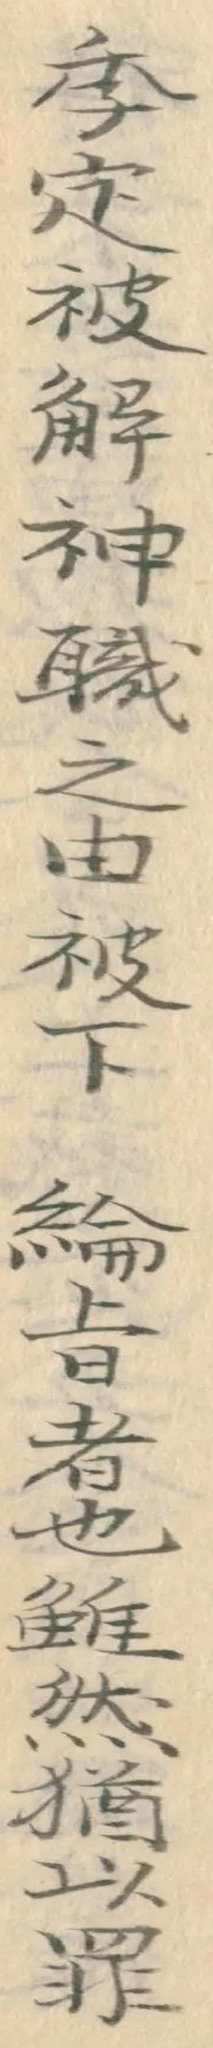季定被解神職之由被下綸旨者也雖然猶以罪

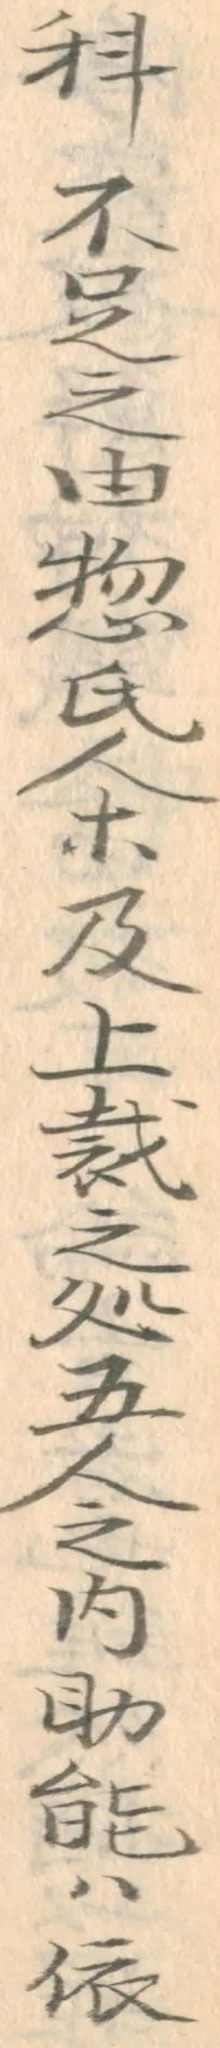科不足之由惣氏人等及上裁之処五人之内助能ハ依
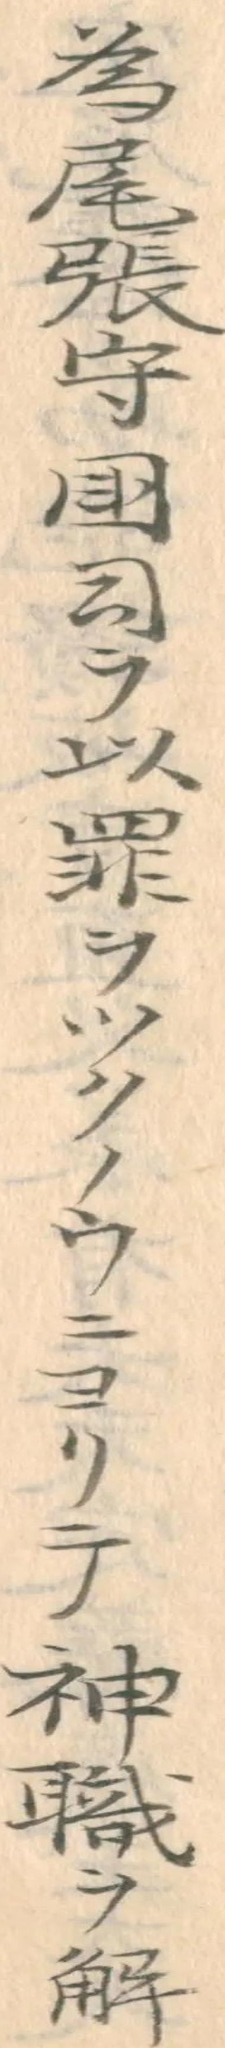為尾張守国司ヲ以罪ヲツクノウニヨリテ神職ヲ解
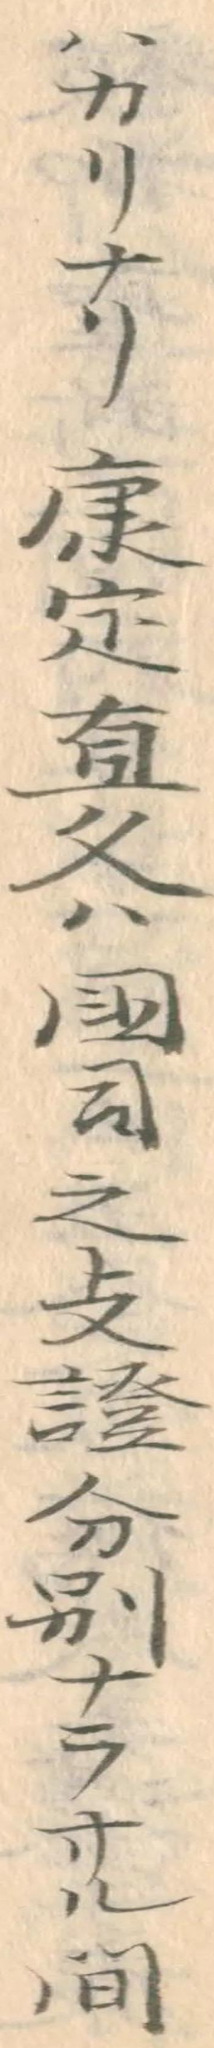ハカリナリ康定直久ハ国司之支証分別ナラサル間
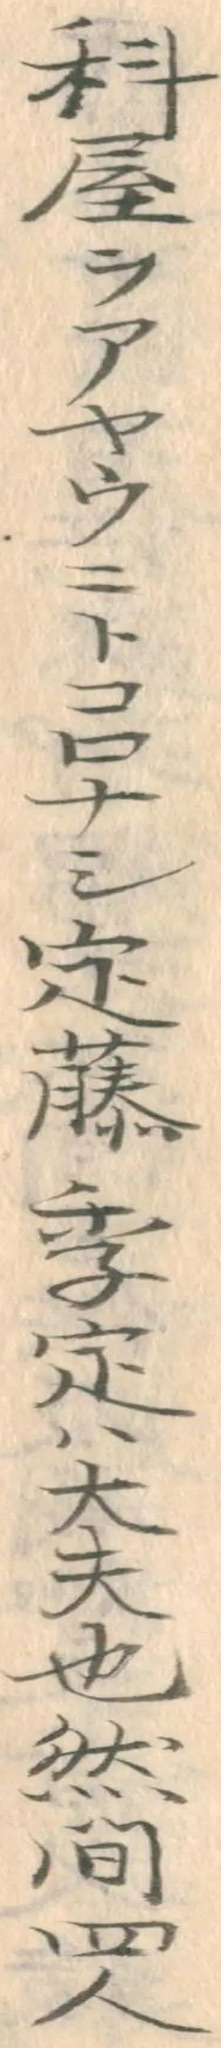科屋ヲアヤウニトコロナシ定藤季定ハ大夫也然間四人
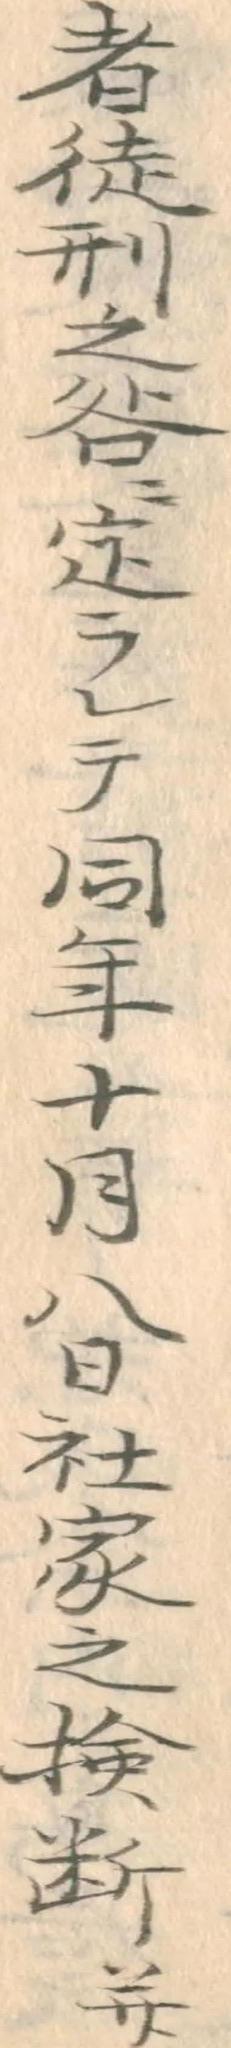者徒刑之咎ニ定ラレテ同年十月八日社家之検断并
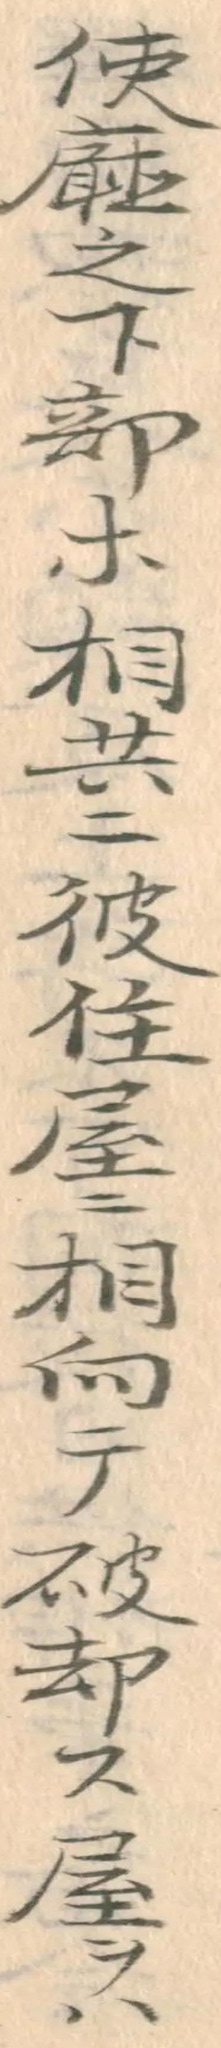使庁之下部等相共ニ彼住屋ニ相向テ破却ス屋ヲハ
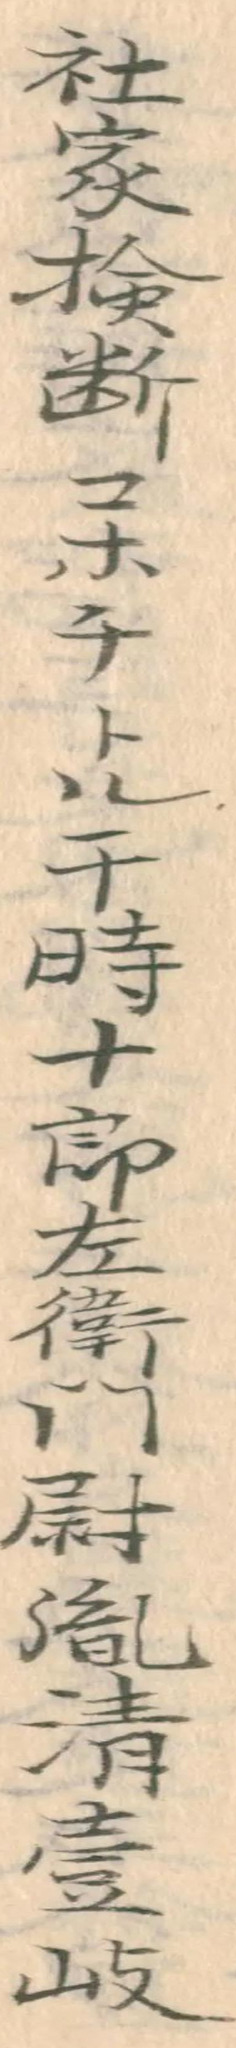社家検断コホチトル于時十郎左衛門尉胤清壱岐
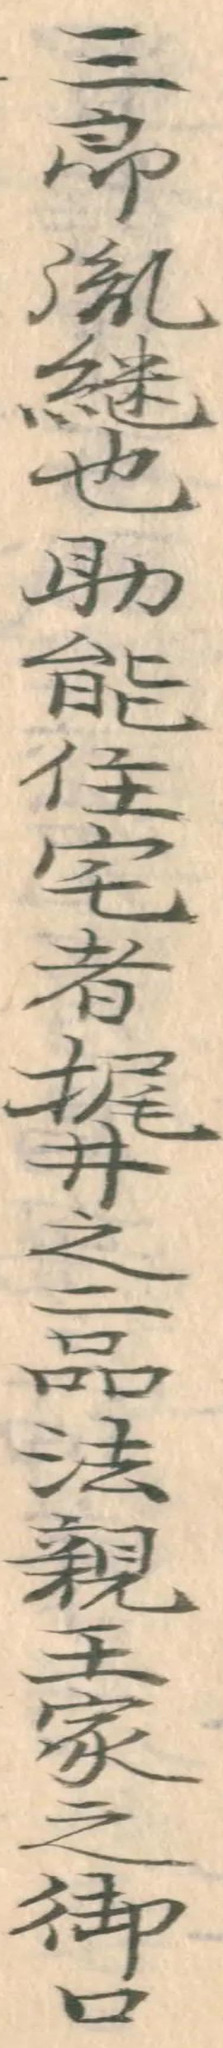三郎胤継也助能住宅者梶井之二品法親王家之御口
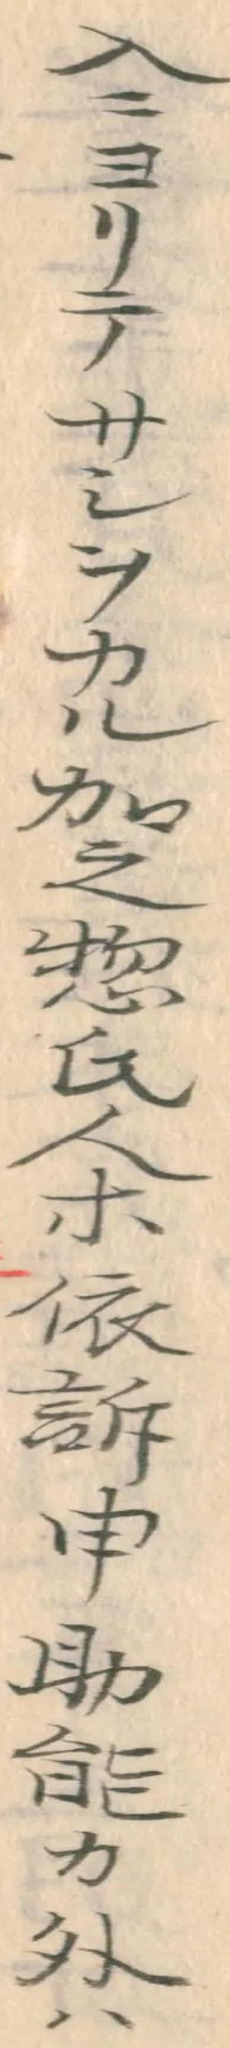入ニヨリテサシヲカル加之惣氏人等依訴申助能カ外ハ
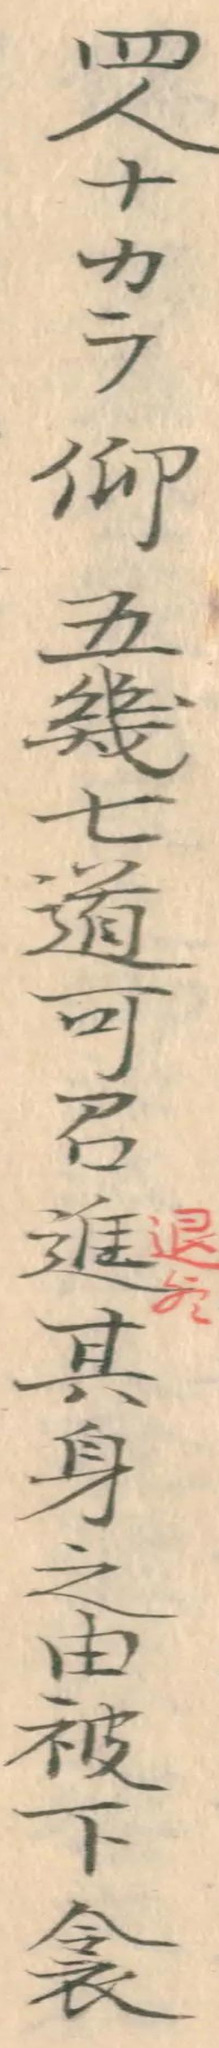四人ナカラ仰五幾七道可召進其身之由被下衾
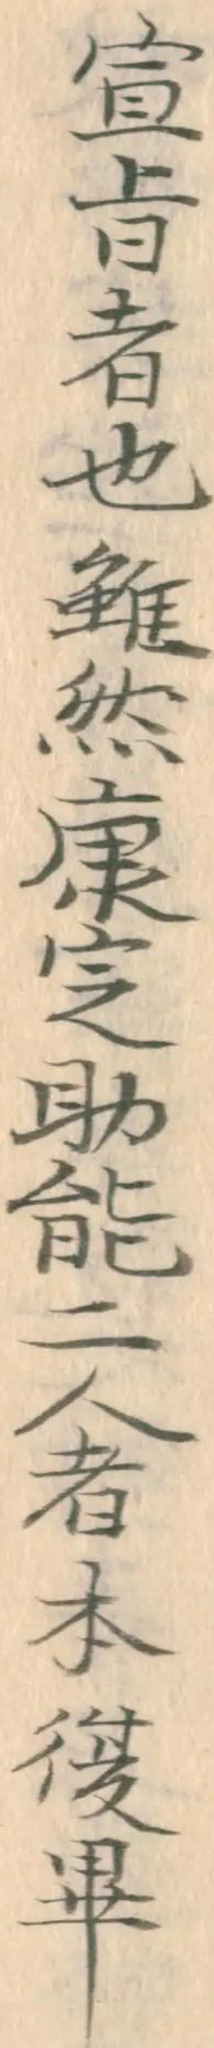宣旨者也雖然康定助能二人者本復畢
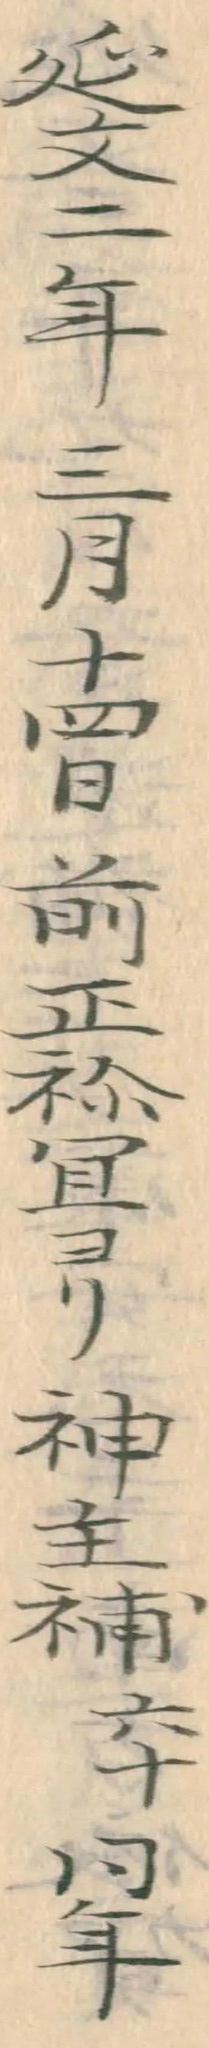延文二年三月十四日前正祢宜ヨリ神主補六十同年
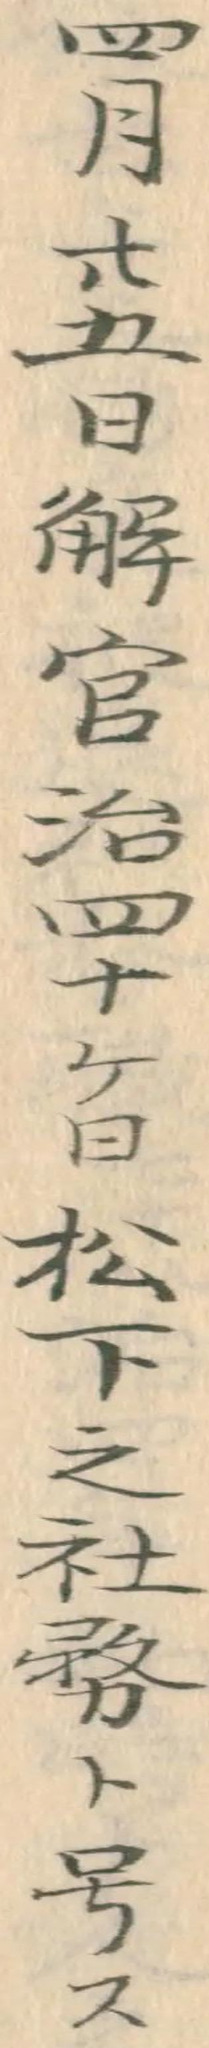四月廿五日解官治四十ケ日松下之社務ト号ス
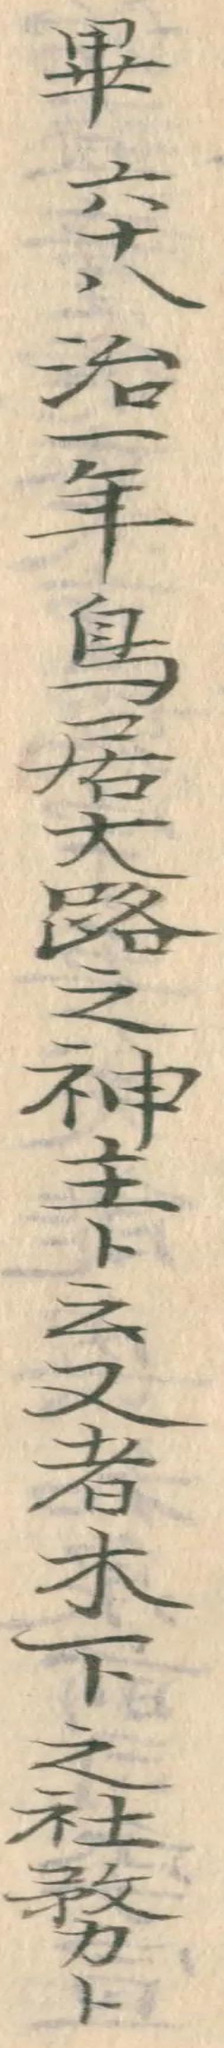畢六十八治一年鳥居大路之神主ト云又者木下之社務ト
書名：賀茂社記録. 第24冊
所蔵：国立国会図書館 National Diet Library, JAPAN
